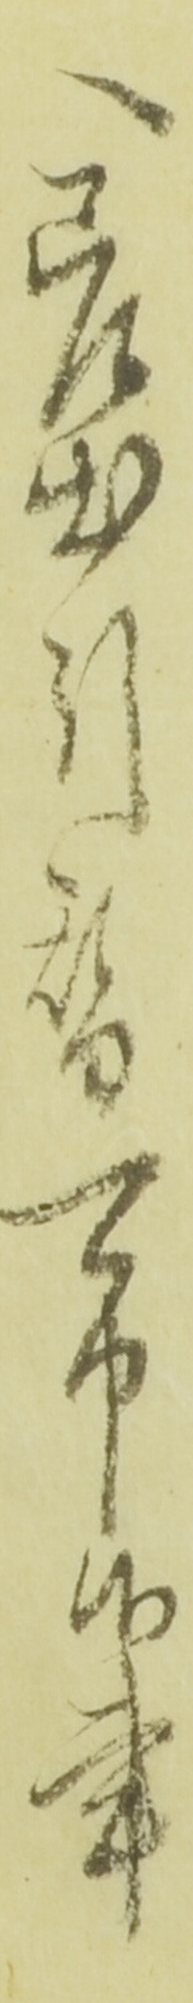へ差出引替可申候事
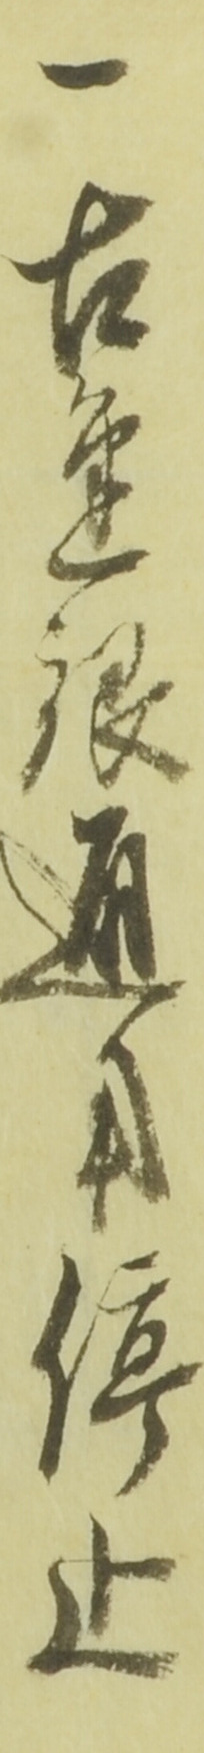一古金銀通用停止
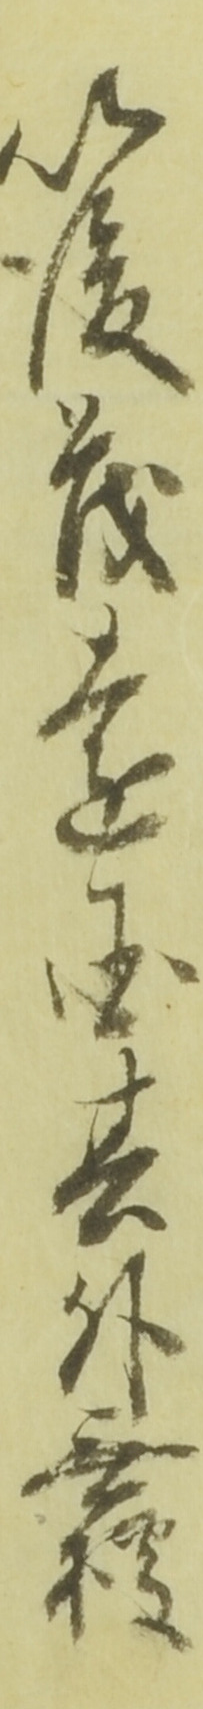以後も遠国其外無拠
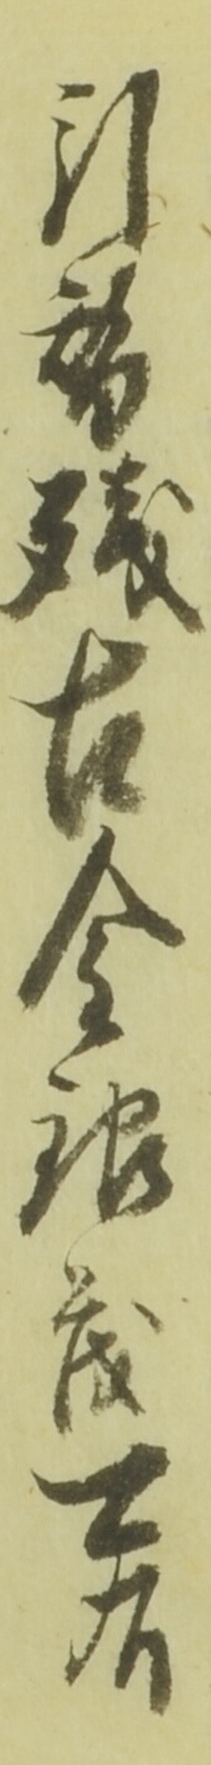引替残古金銀も可有
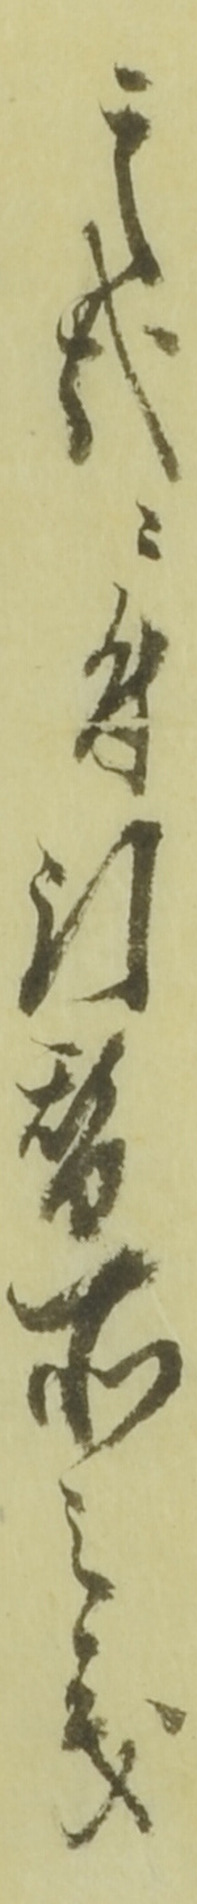之哉ニ付引替所之義
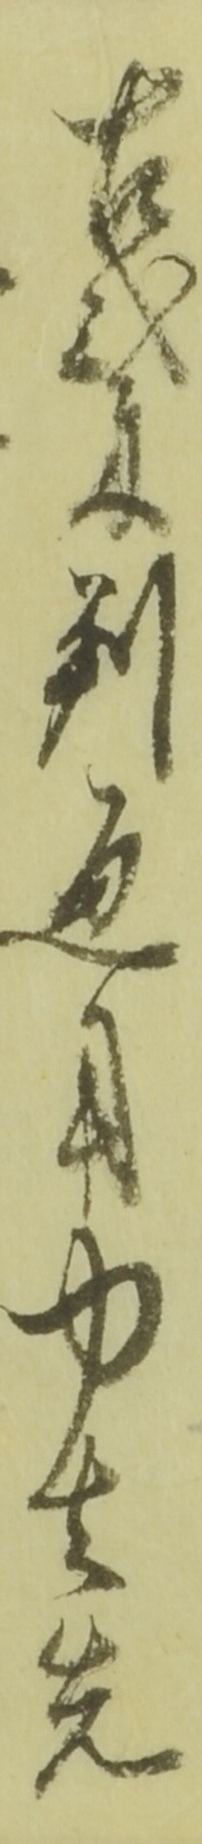古弐朱判通用中は先
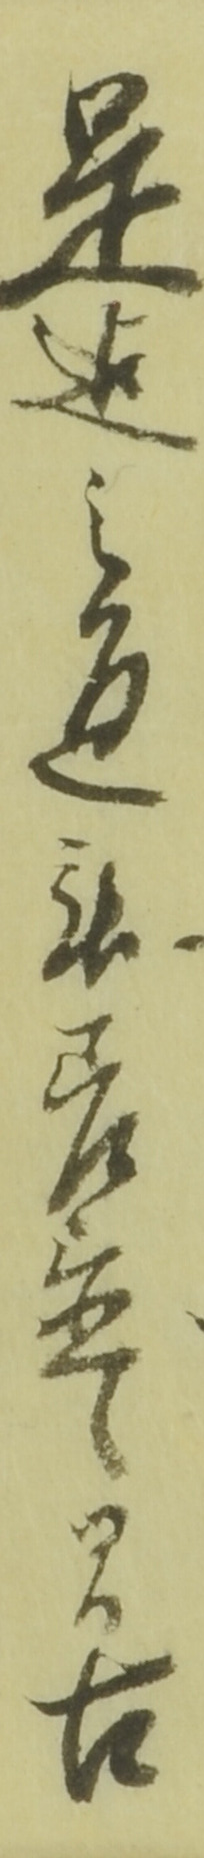是迄之通被差置候間古
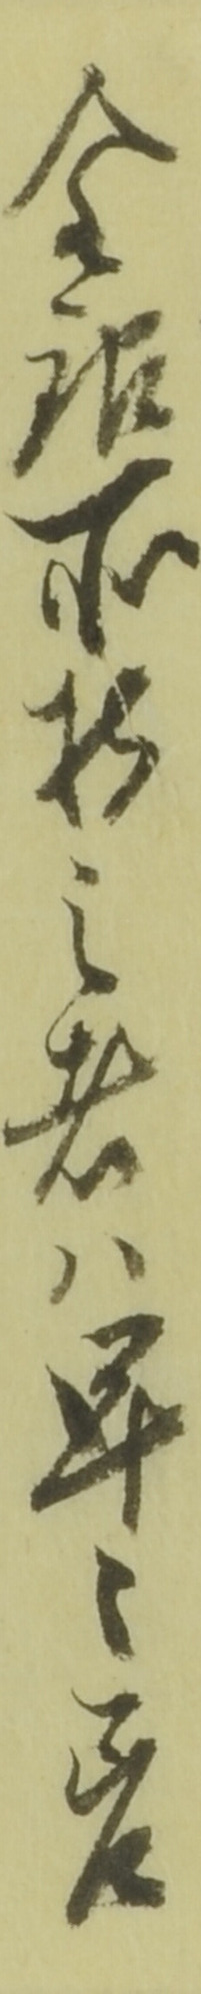金銀所持之者ハ早々差
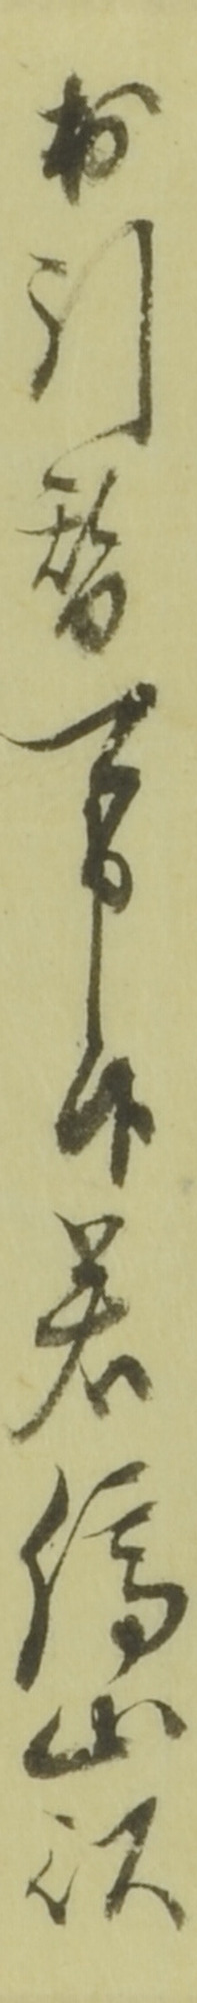出引替可申候若停止以
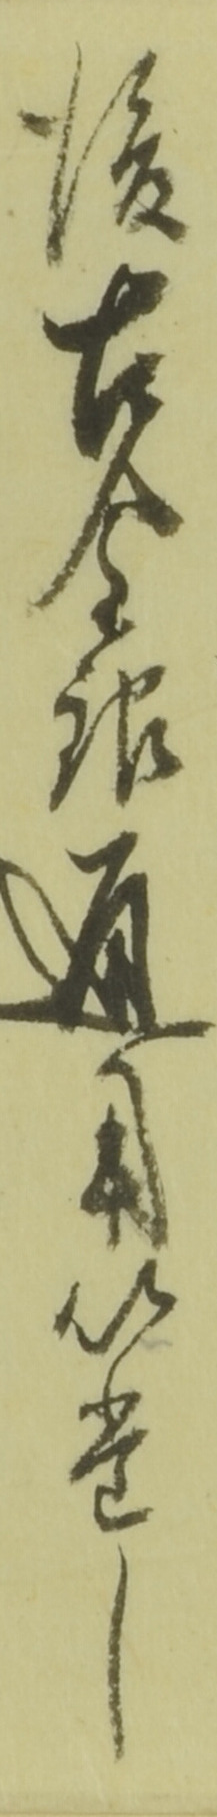後古金銀通用いたし
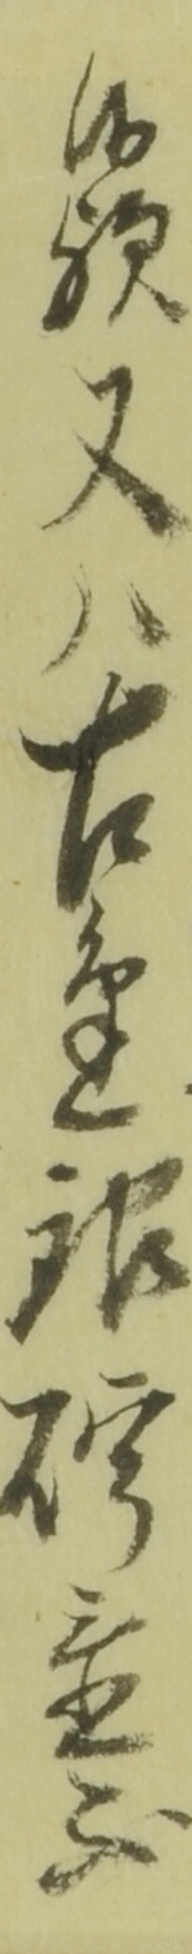候歟又ハ古金銀貯置不
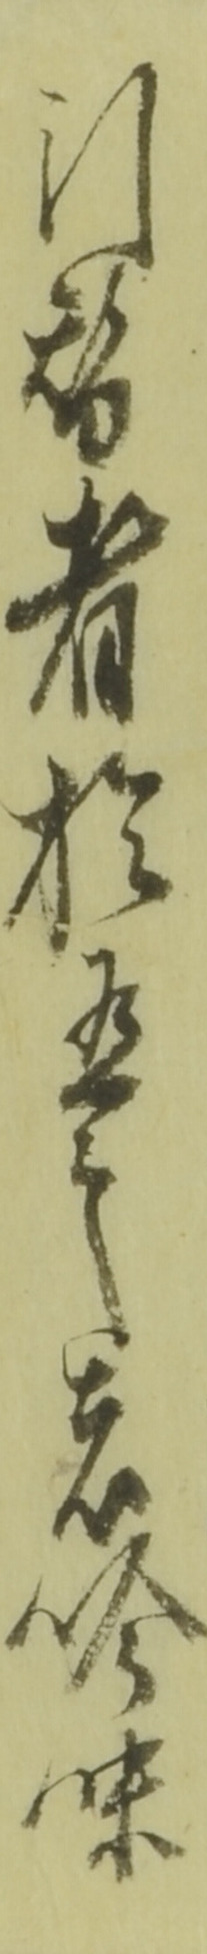引替者於有之は吟味
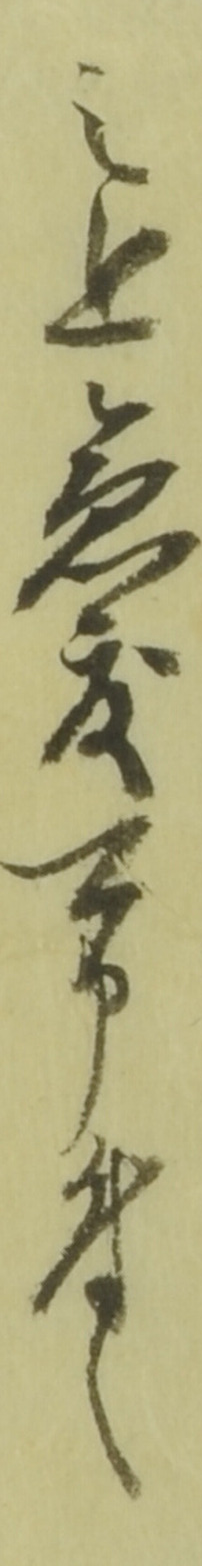之上急度可申付候

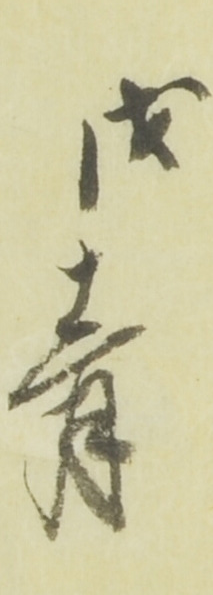戌十二月
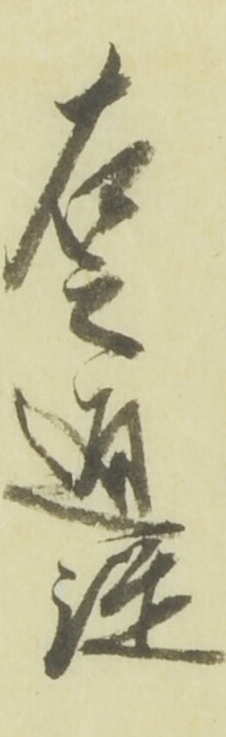右之通従
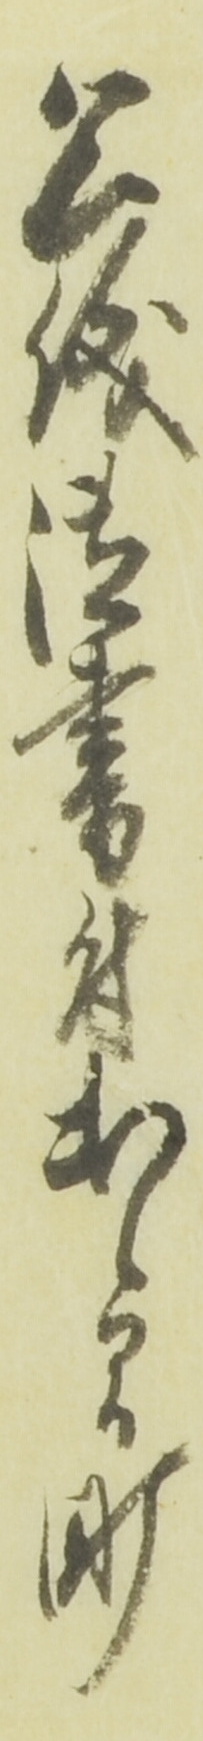公儀御書付出候間町
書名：御触書御書附控
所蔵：伊那市立高遠町図書館・合同会社AMANE
